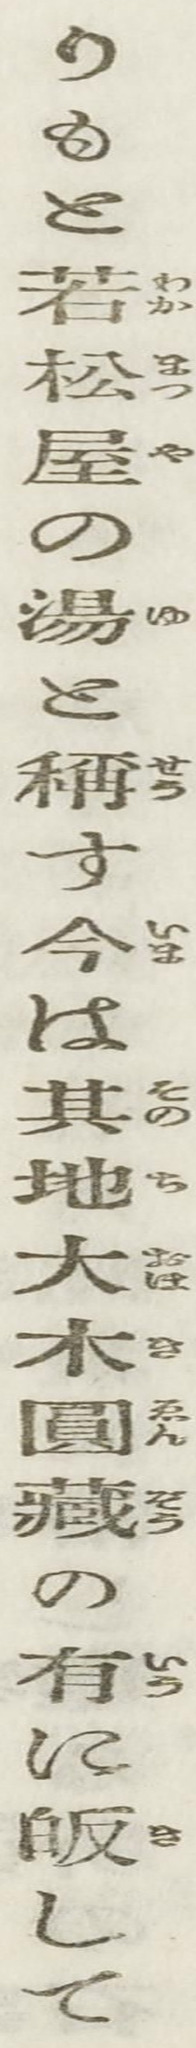りもと若松屋の湯と称す今は其地大木圓蔵の有に皈して
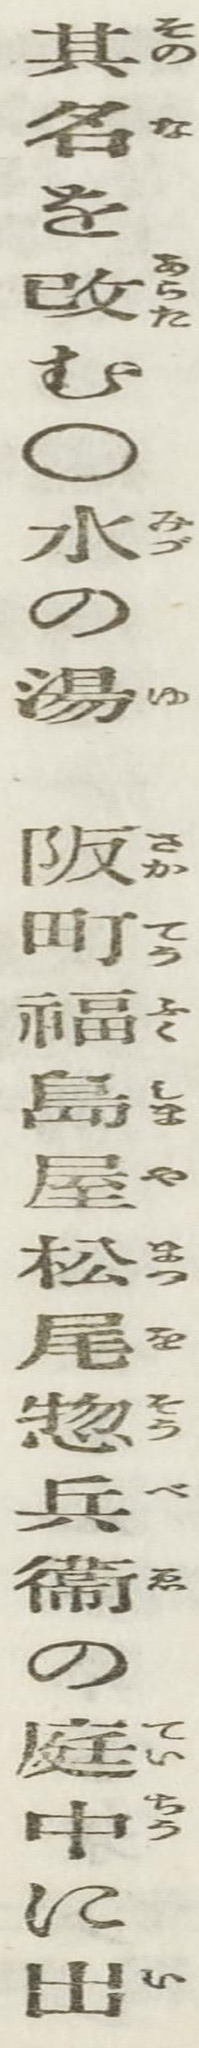其名を改む○水の湯阪町福島屋松尾惣兵衛の庭中に出
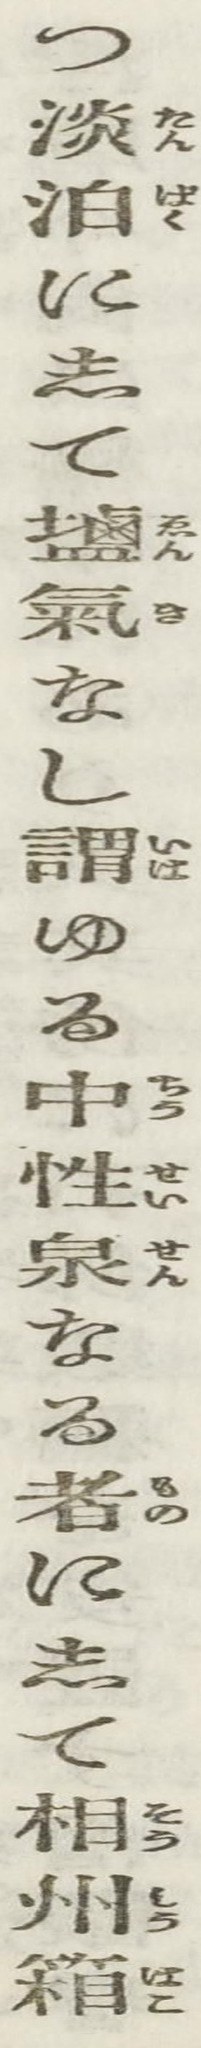つ淡泊にして塩氣なし謂ゆる中性泉なる者にして相州箱
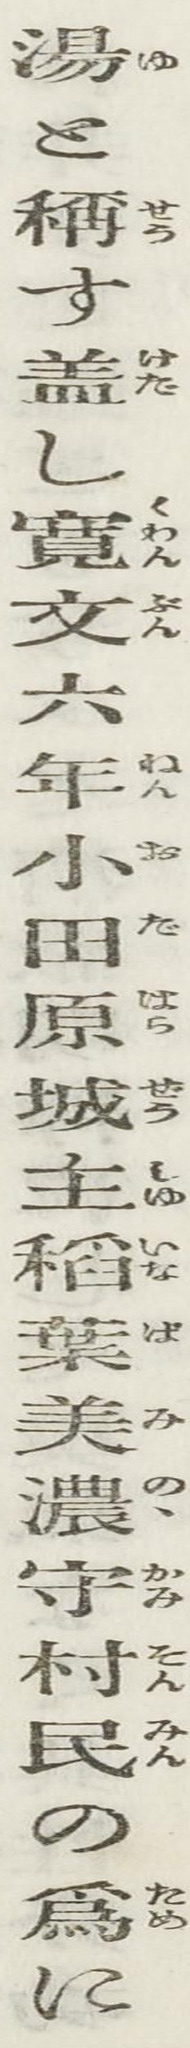湯と称す蓋し寛文六年小田原城主稲葉美濃守村民の為に
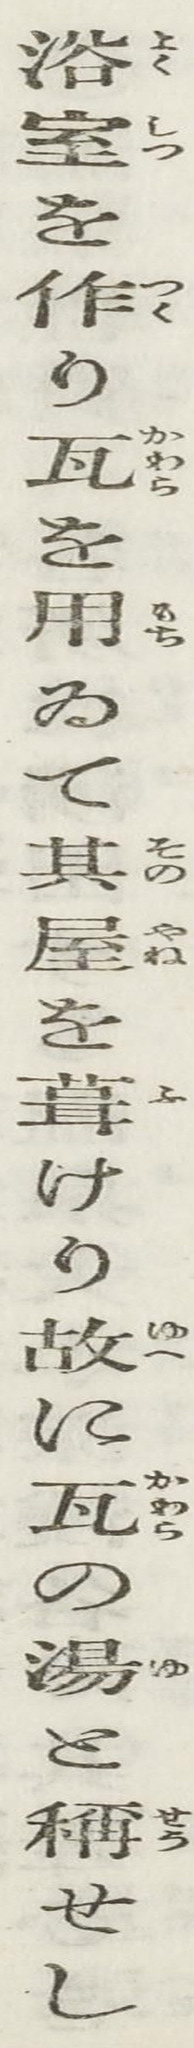浴室を作り瓦を用ゐて其屋を葺けり故に瓦の湯と称せし
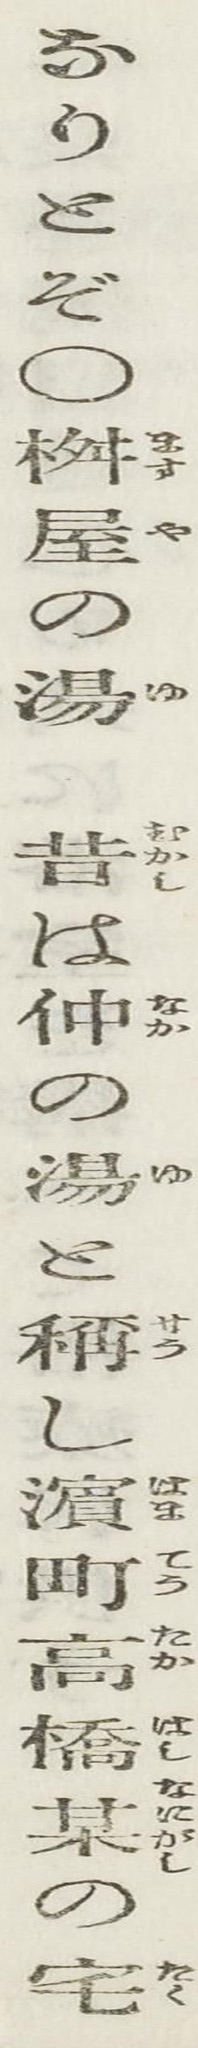なりとぞ○枡屋の湯昔は仲の湯と称し浜町高橋某の宅
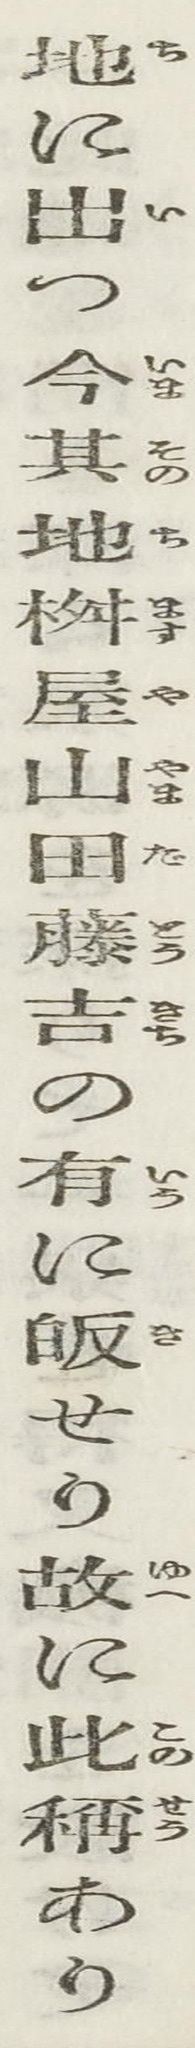地に出つ今其地枡屋山田藤吉の有も皈せり故に此称あり
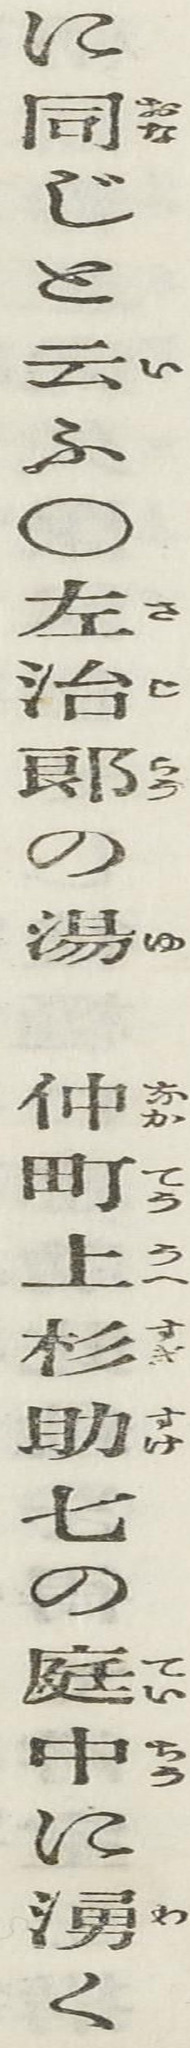に同じと云ふ○左治郎の湯仲町上杉助七の庭中に湧く
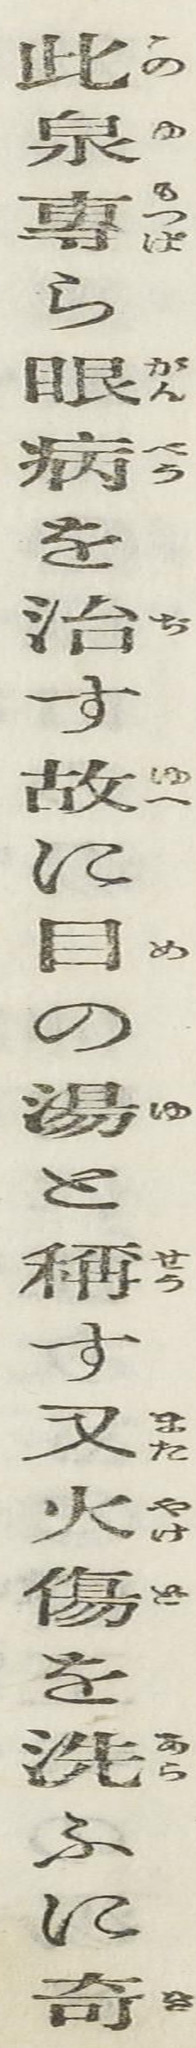此泉専ら眼病を治す故に目の湯と称す又火傷を洗ふ奇

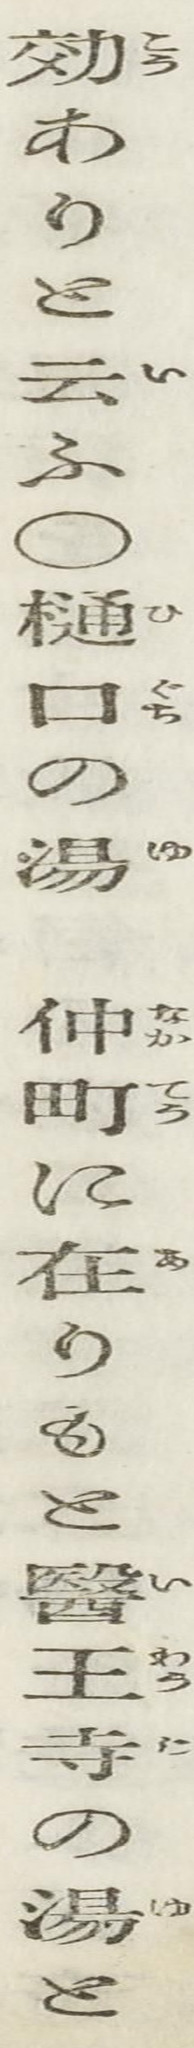効ありと云ふ○樋口の湯仲町に在りもと醫王寺の湯と
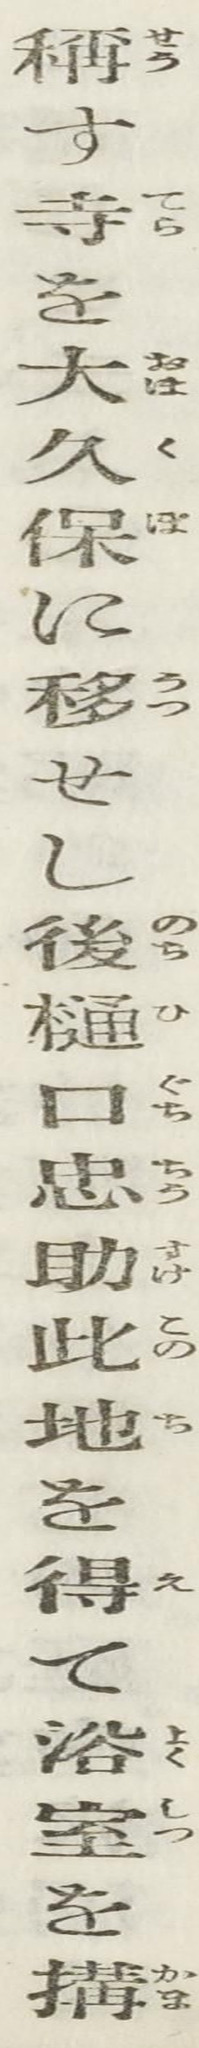称す寺を大久保に移せし後樋口忠助此地を得て浴室を構
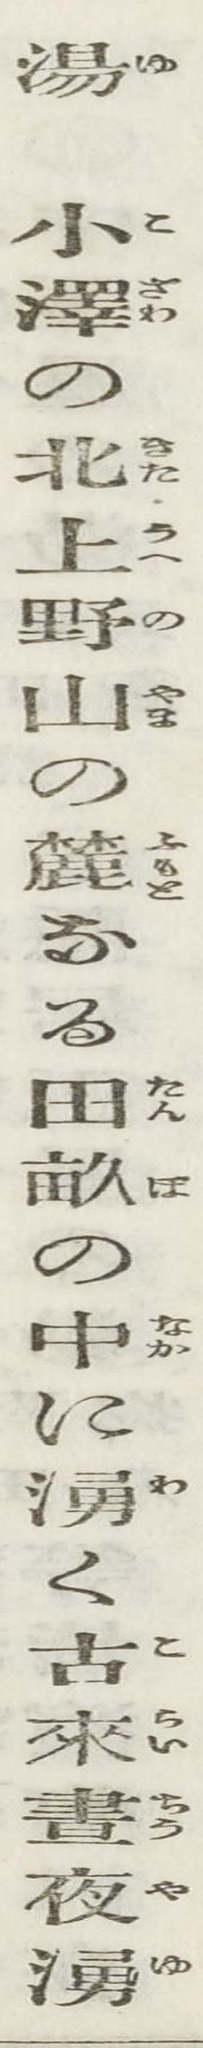湯小澤の北上野山の麓なる田畝の中に湧く古来晝夜湧
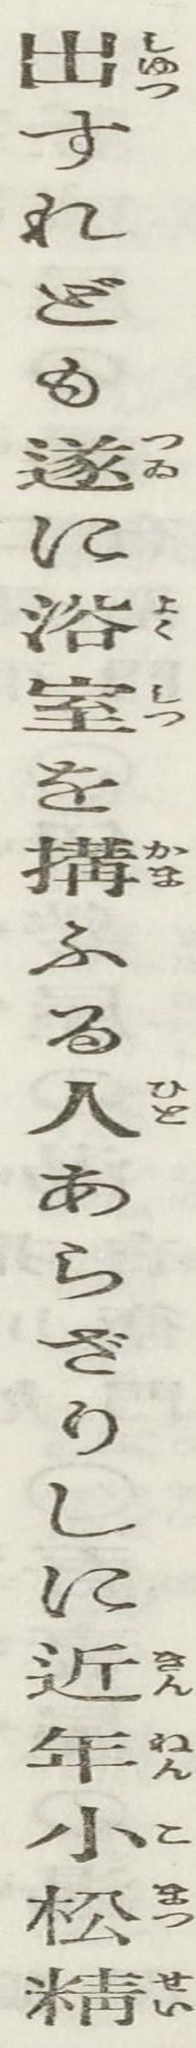出すれども遂に浴室を構ふる人あらざりしに近年小松精
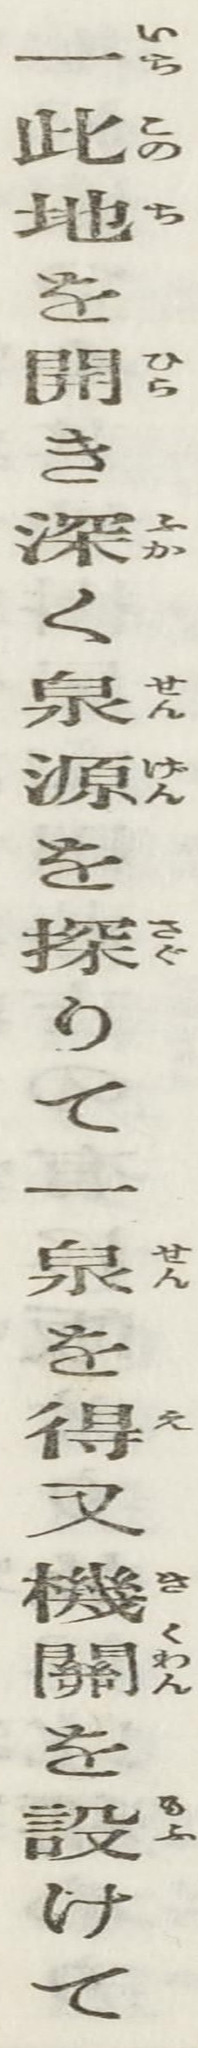一此地を開き深く泉源を探りて一泉を得又機関を設けて
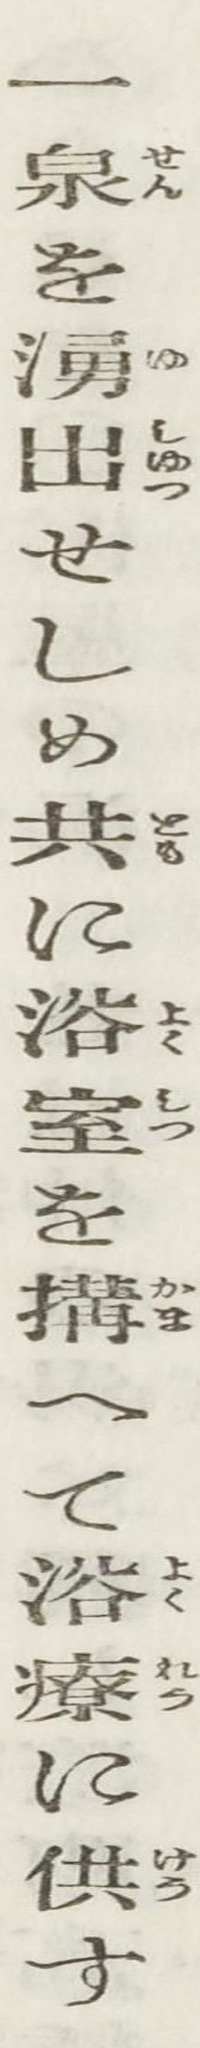一泉を湧出せしめ共に浴室を構へて浴療に供す
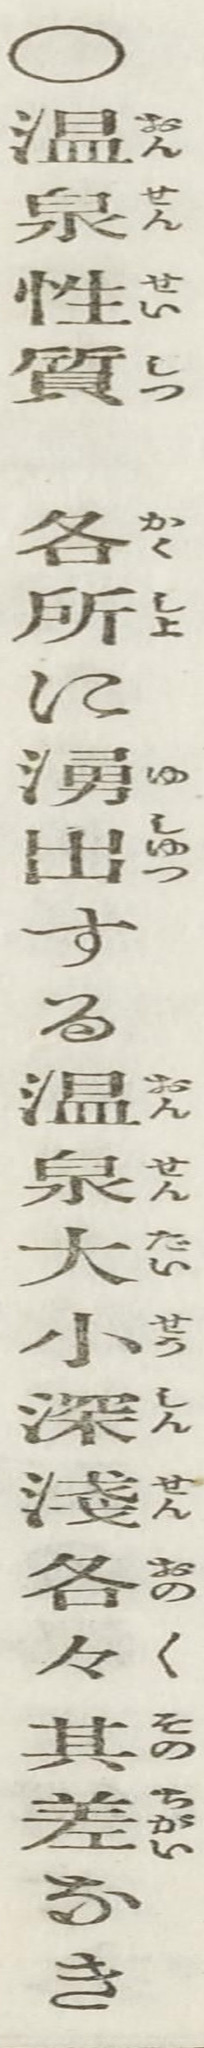○温泉性質各所に湧出する温泉大小深浅各々其差なき
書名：熱海獨案内　全
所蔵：東京大学地震研究所図書室 Earthquake Research Institute Library, The University of Tokyo, JAPAN
